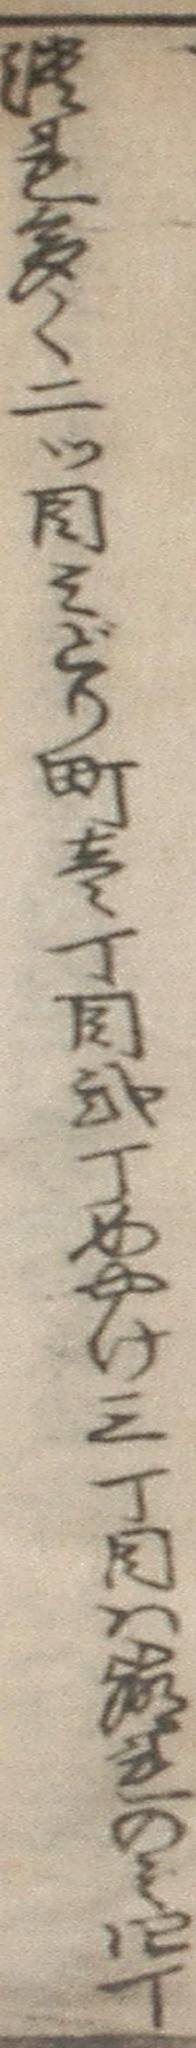潰れ多く二ツ目みどり町壱丁目弐丁めやけ三丁目は崩れのみ四丁
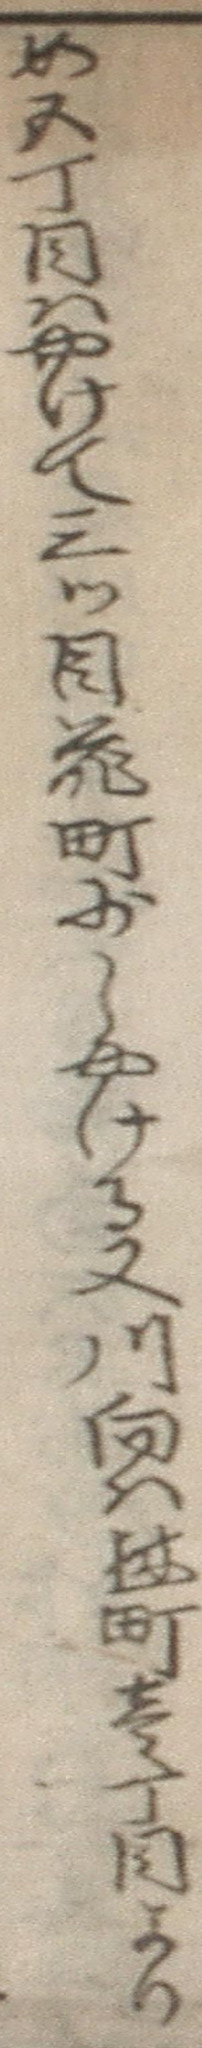め五丁目はやけて三つ目花町少しやける又川向は林町壱丁目より
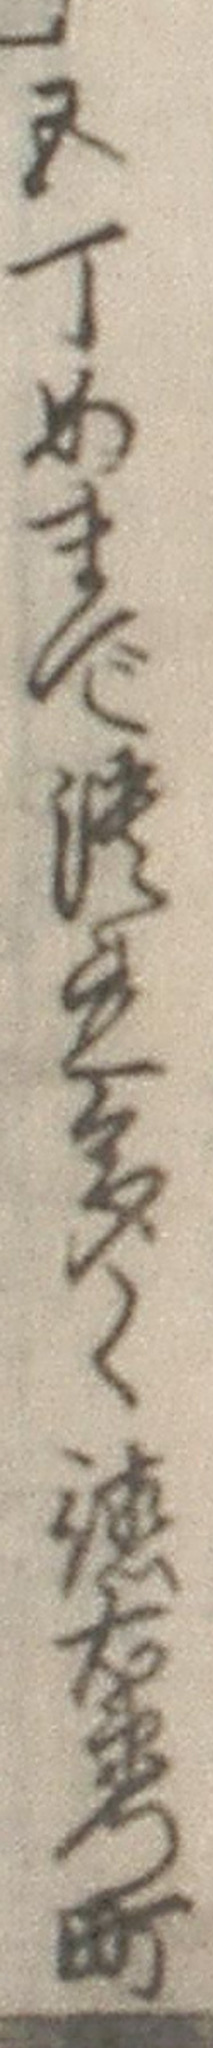五丁めまで潰れ多く徳右衛門町
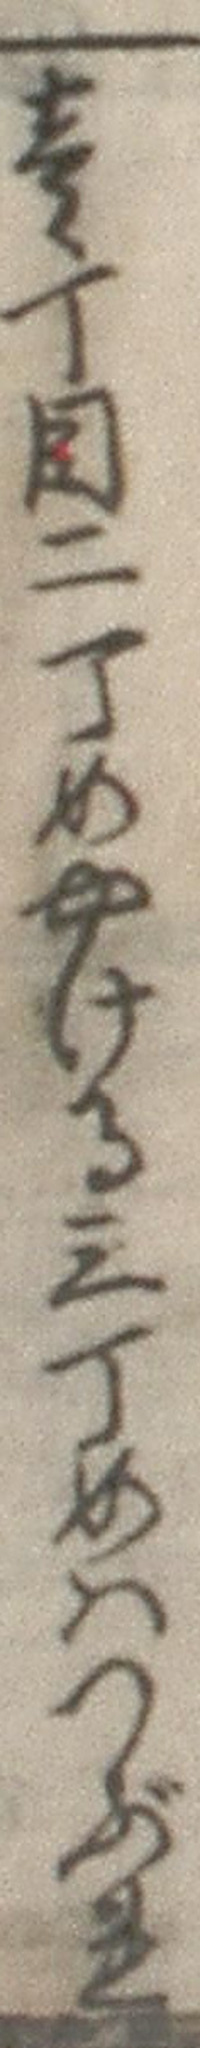壱丁目二丁めやける三丁めはつぶれ
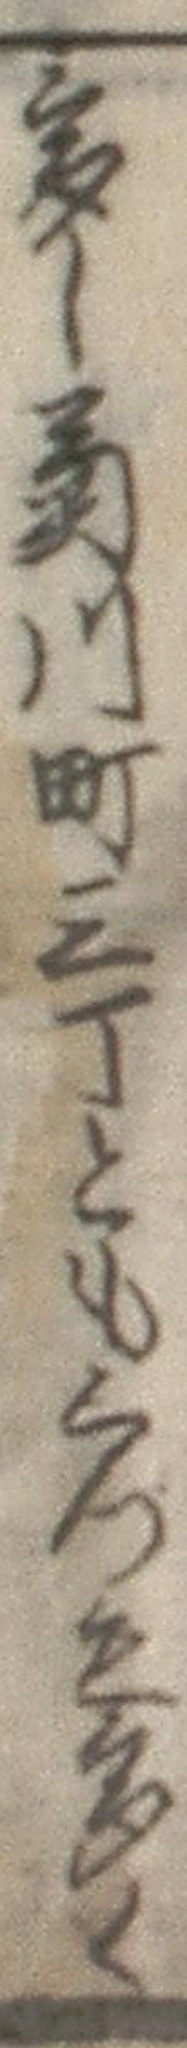多し菊川町三丁ともくつれ多く
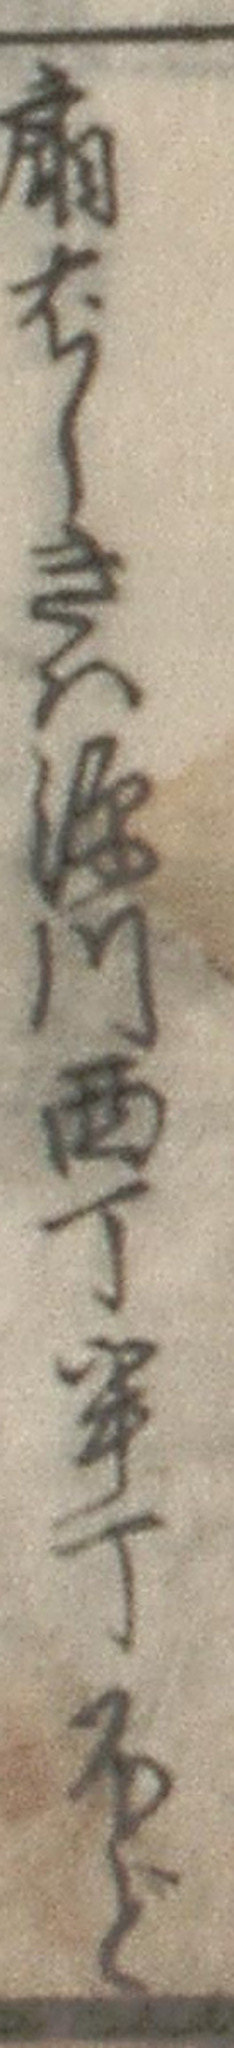扇ばしきは深川西丁半丁ほど
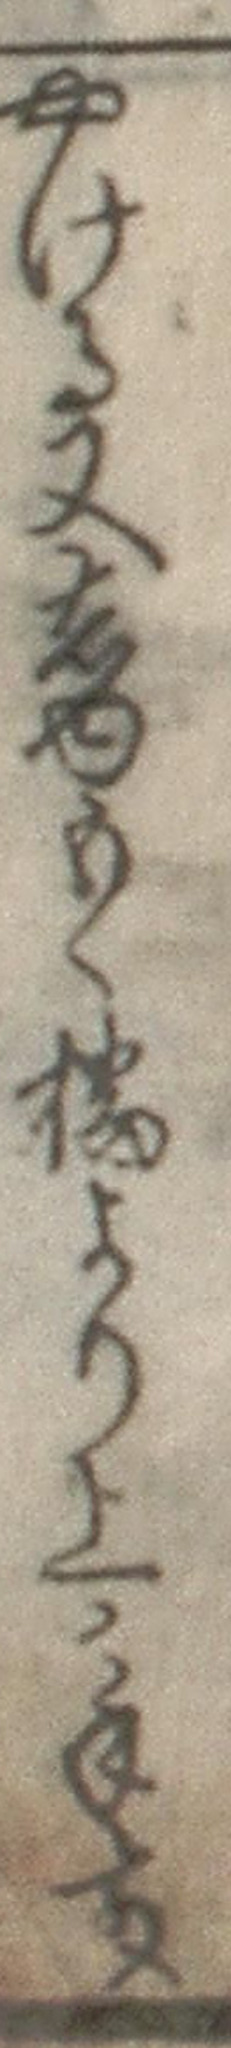やける又しゆもく橋より上の手？両
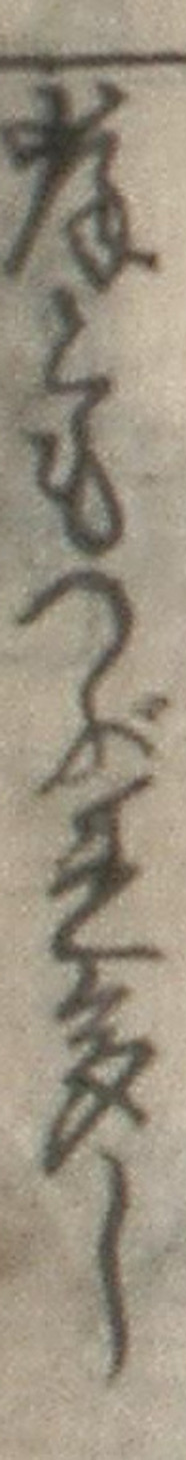岸ともつぶれ多し

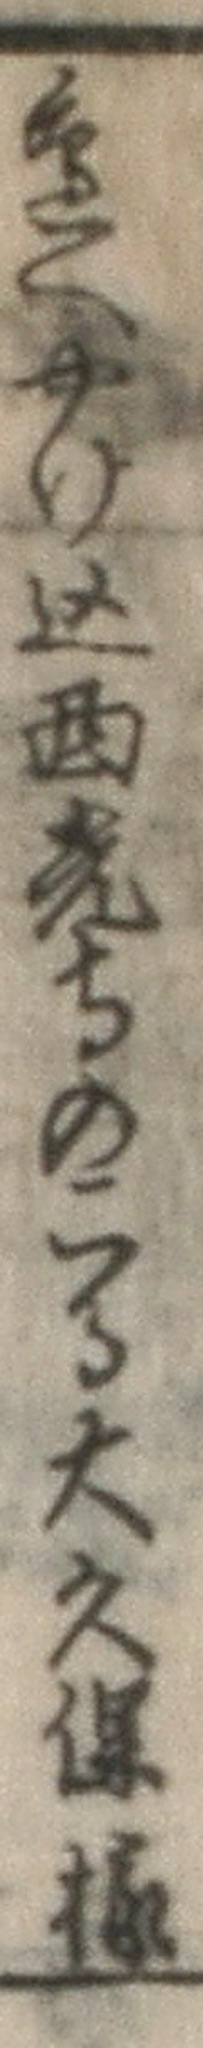辺へやけ込西光寺のこる大久保様
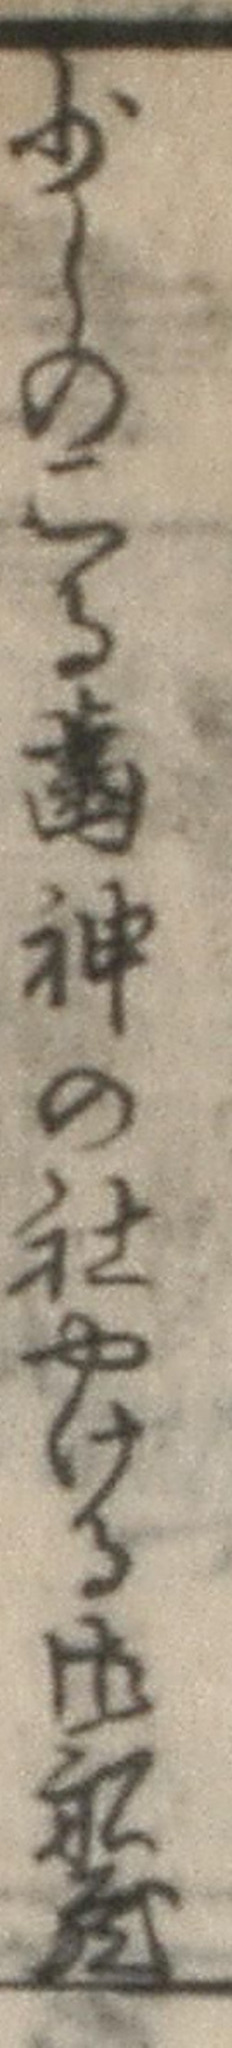少しのこる歯神の社やける御船蔵
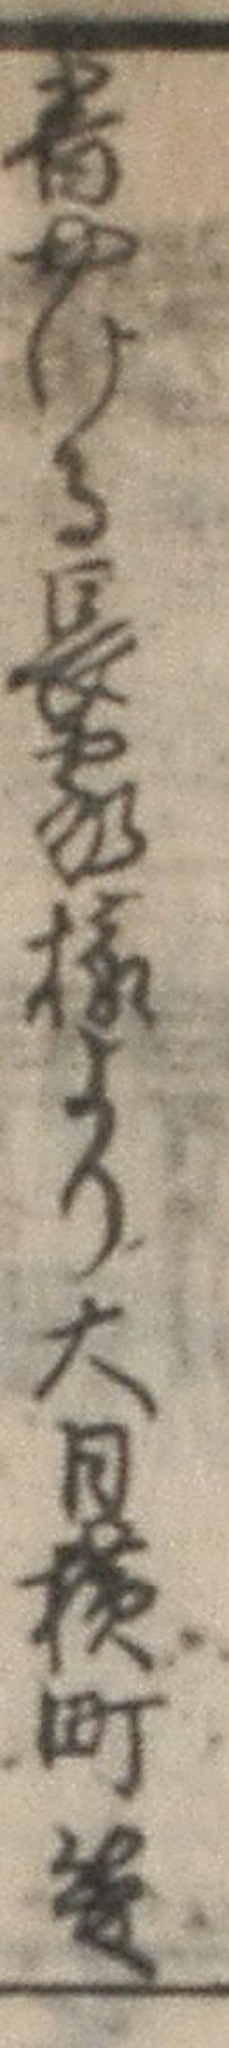番やける長家様より大日横町菅
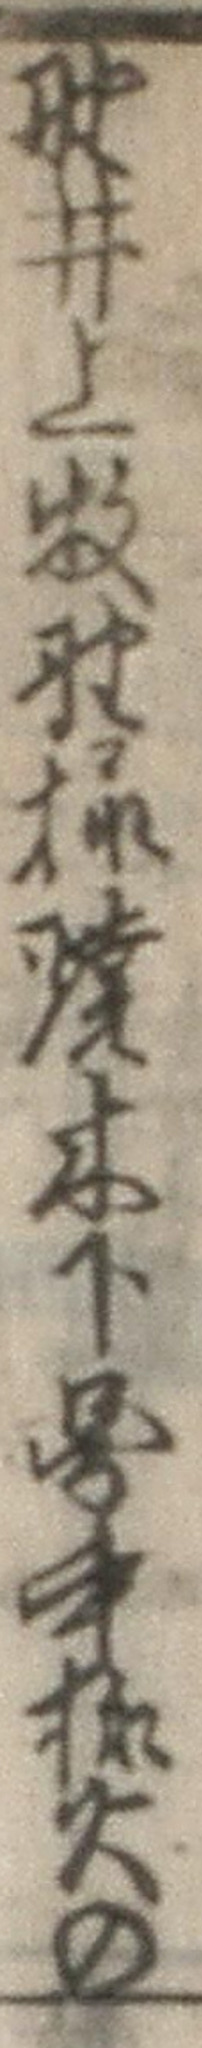野井上牧野様焼木下図書様火の
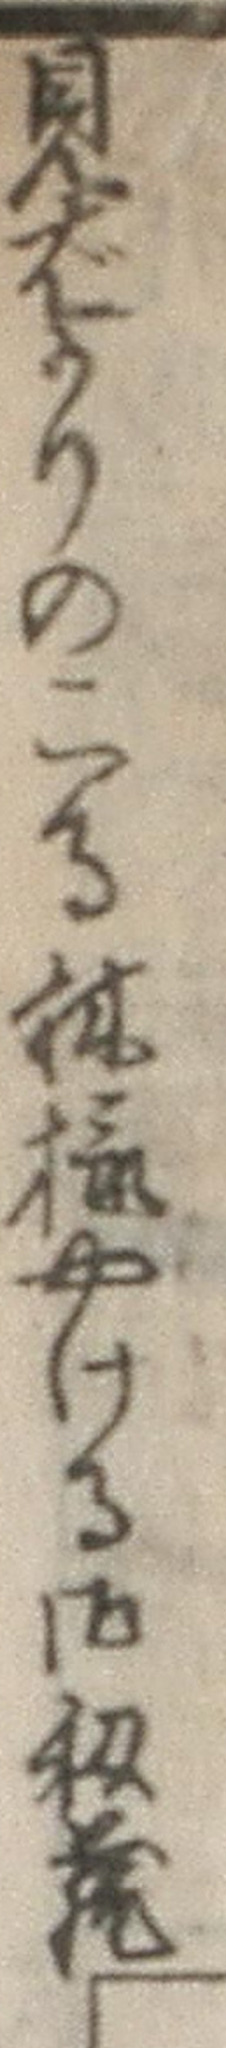見ばかりのこる林様やける御籾蔵
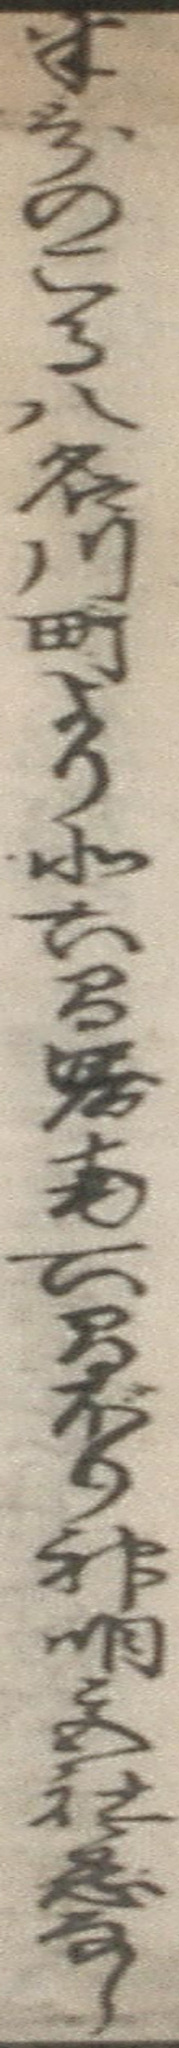半分のこる八名川町より北六間堀南六間ぼり神明宮社恙なし
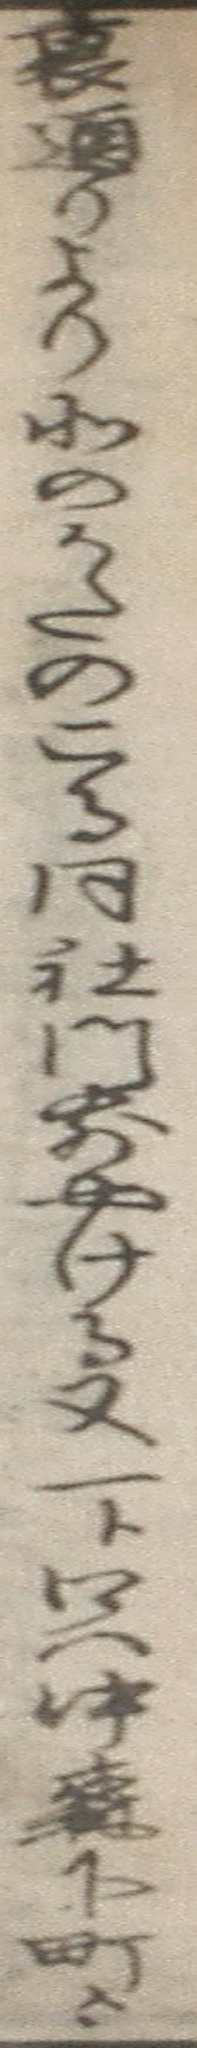裏通りより北のかたのこる同社門前やける又一ト口ハ中森下町ゟ
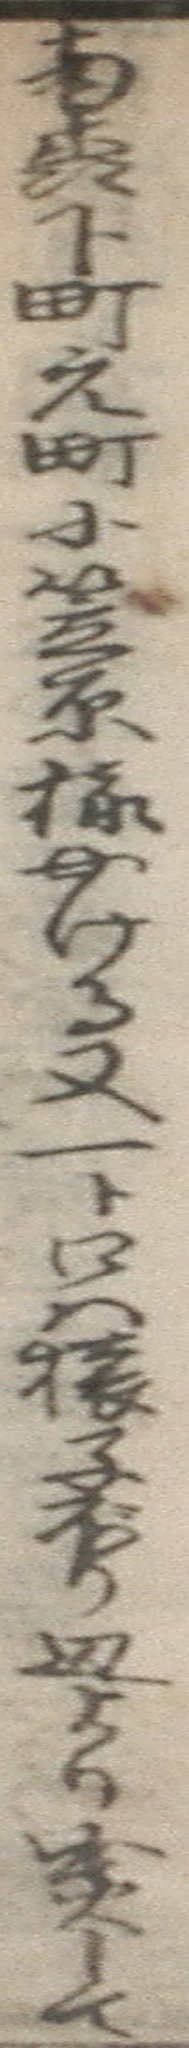南森下町元町小笠原様やける又一ト口ハ猿子ぼり辺より出火して
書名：江戸大地震末代鑑
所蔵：東京大学地震研究所図書室 Earthquake Research Institute Library, The University of Tokyo, JAPAN
